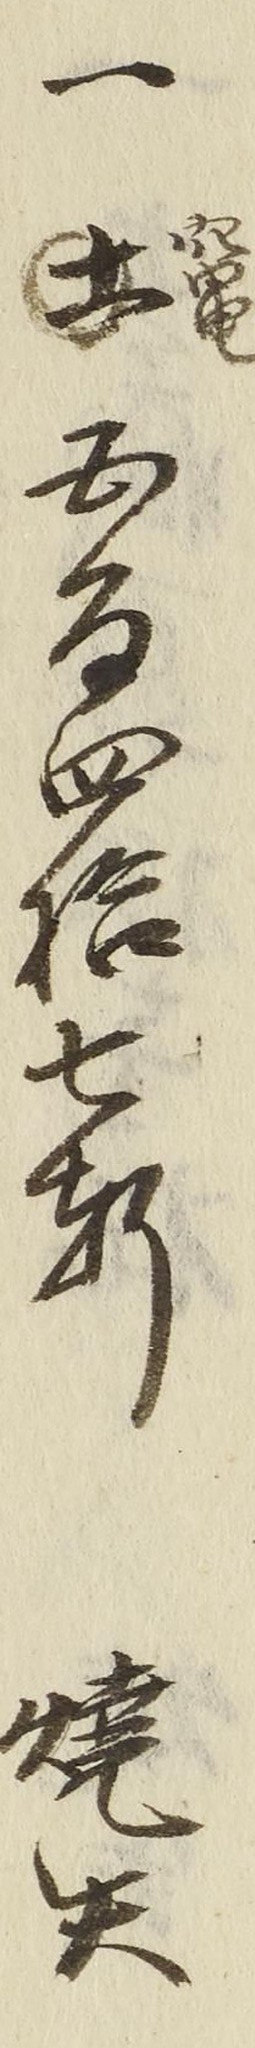一竃五百四拾七軒焼失
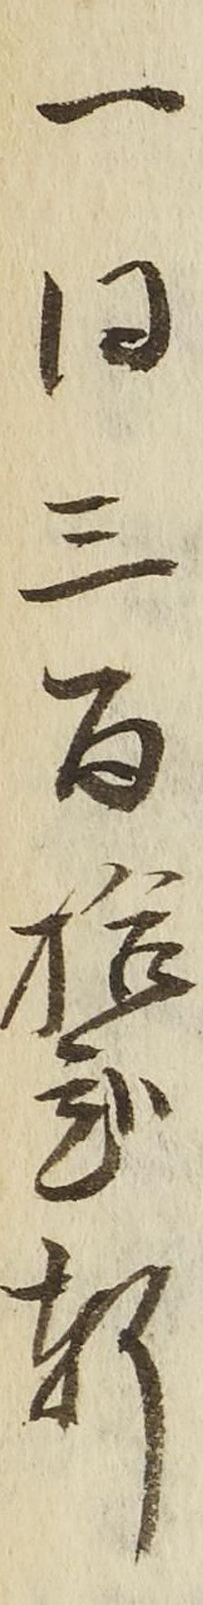一同三百拾弐軒潰

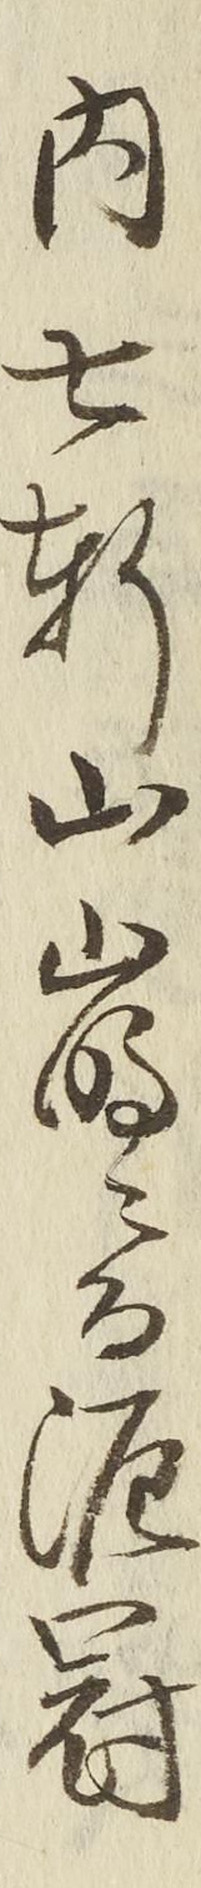内七軒山崩二而泥冠
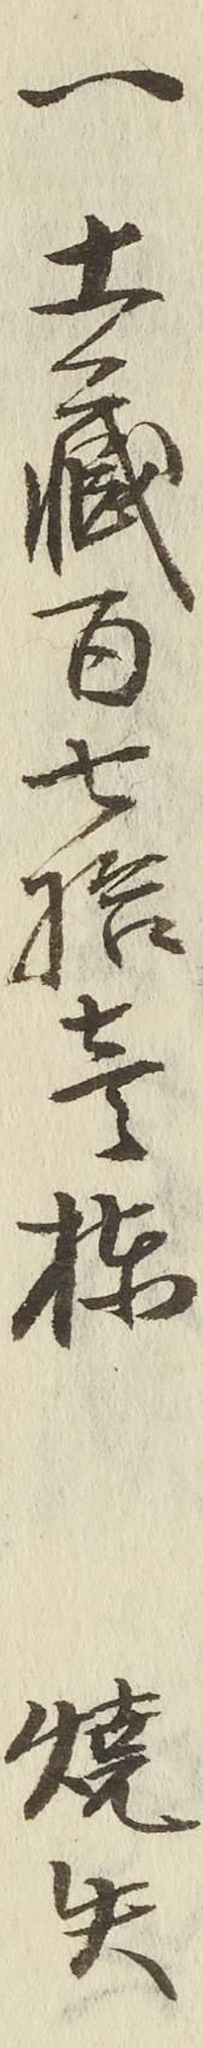一土蔵百七拾壱棟焼失
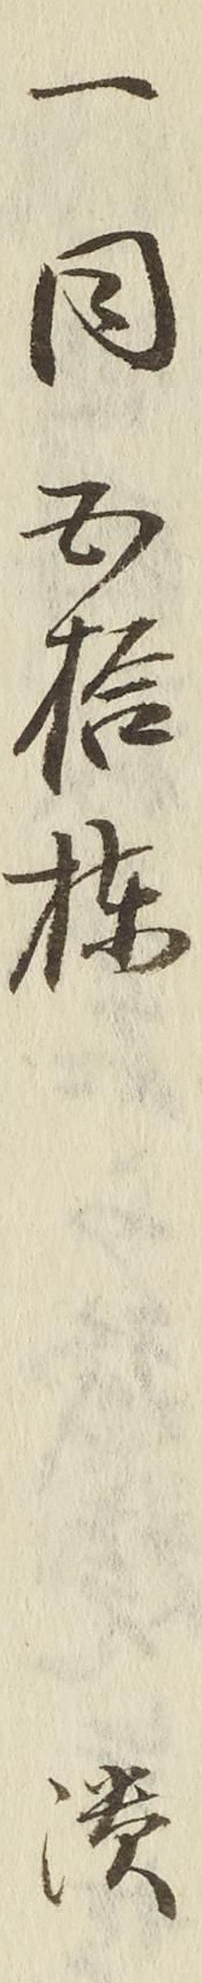一同五拾棟潰
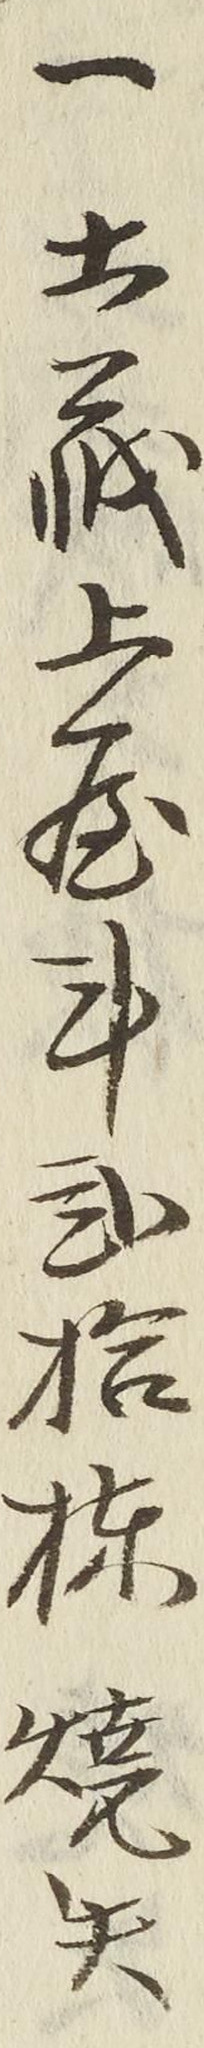一土蔵上屋斗弐拾棟焼失
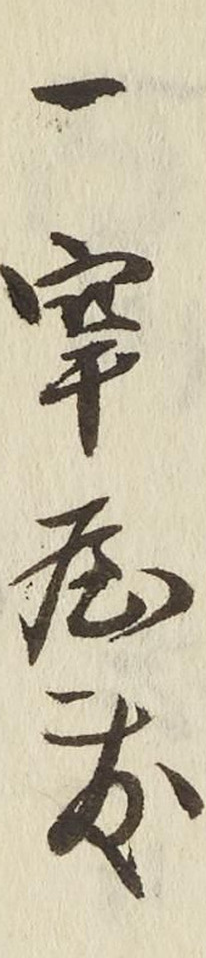一牢屋敷
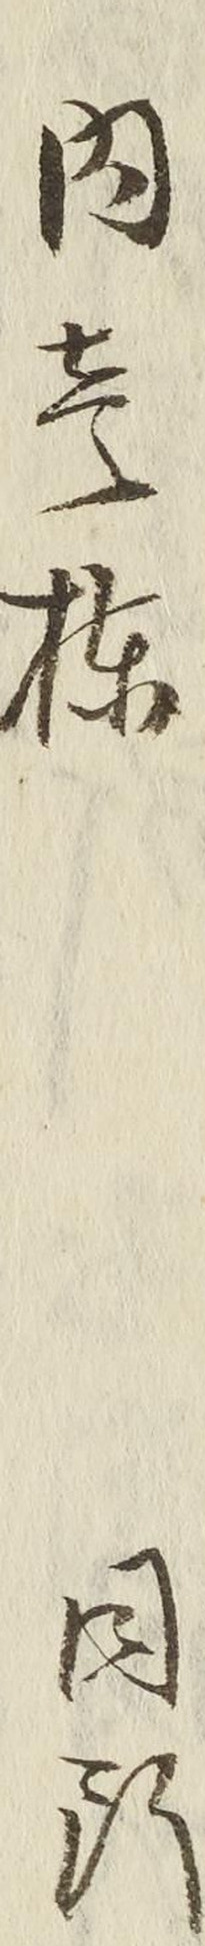内壱棟同断
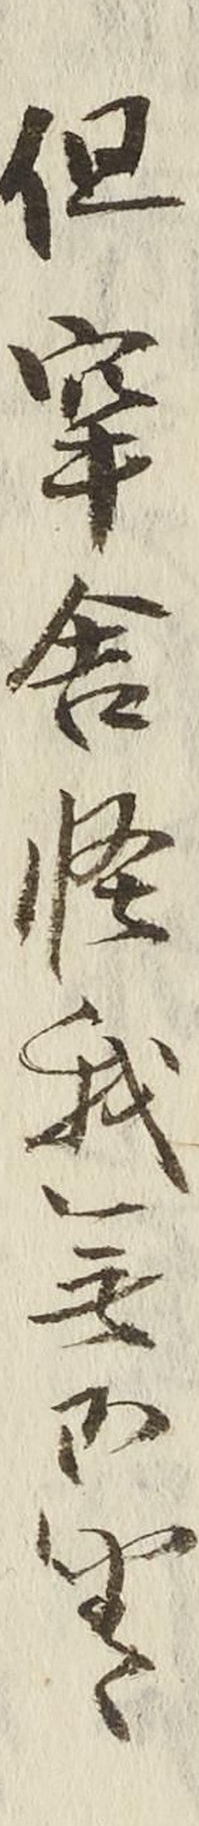但牢舎怪我無御坐候
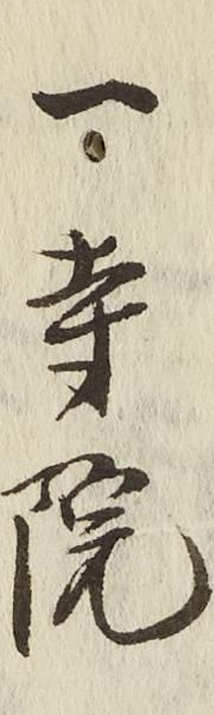一寺院
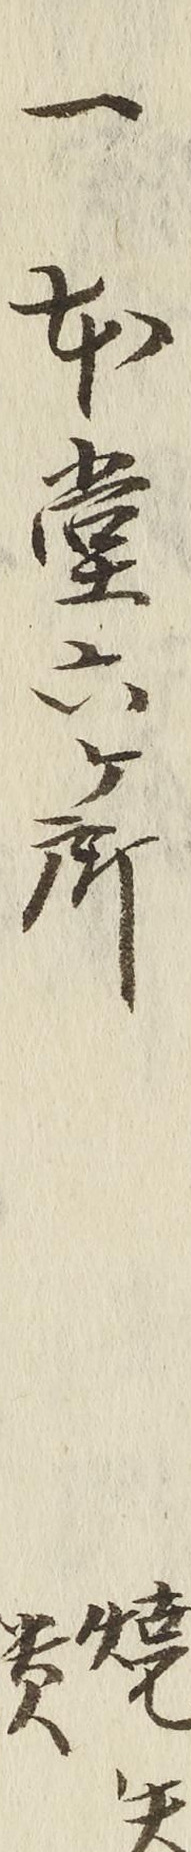一本堂六ヶ所焼失
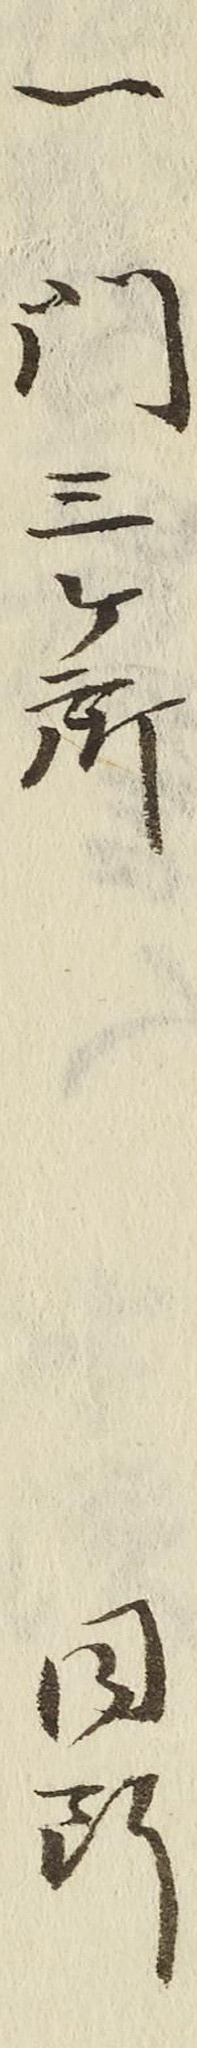一同三ヶ所同断
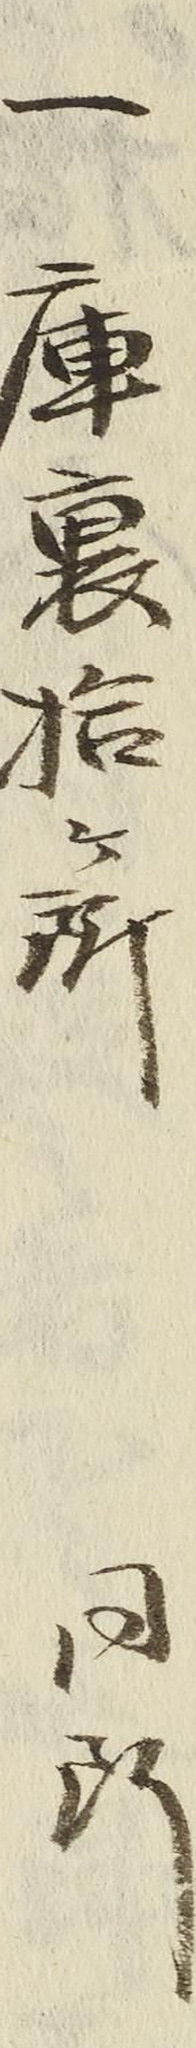一庫裏拾ヶ所同断
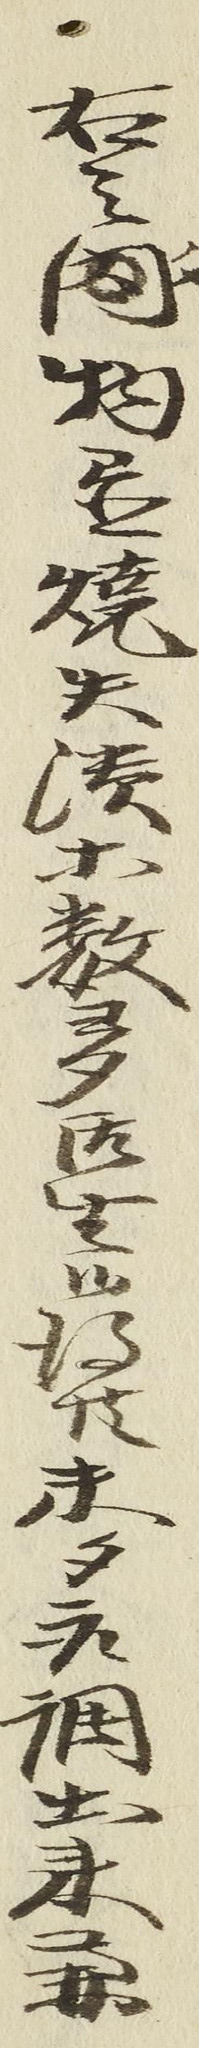右之内物置焼失潰等数多御坐候得共未タ取調出来兼
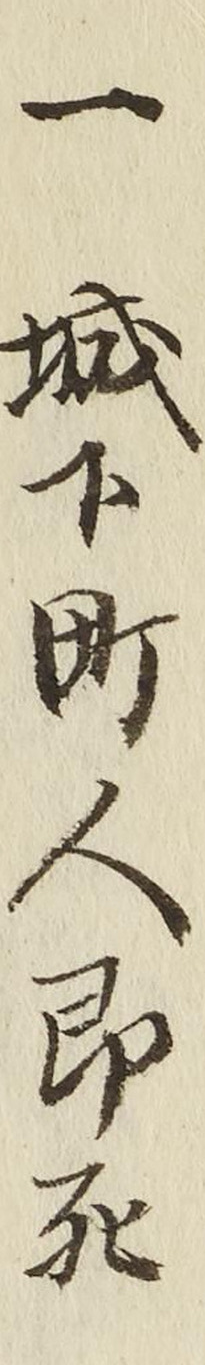一城下町即死
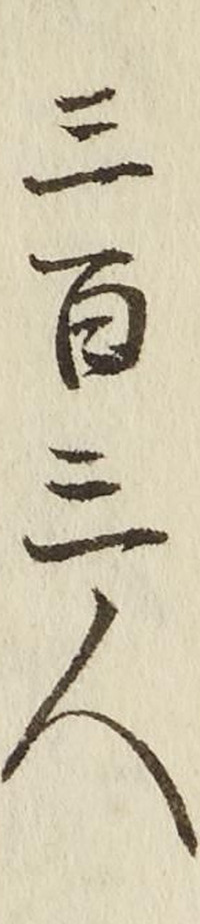三百三人
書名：信濃國大地震記　乾
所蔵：東京大学地震研究所図書室 Earthquake Research Institute Library, The University of Tokyo, JAPAN
